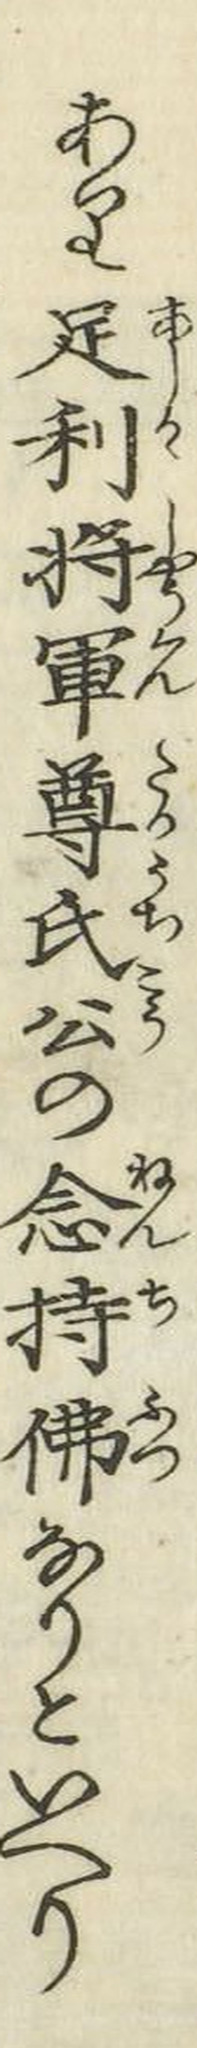あり足利将軍尊氏公の念持佛なりといへり
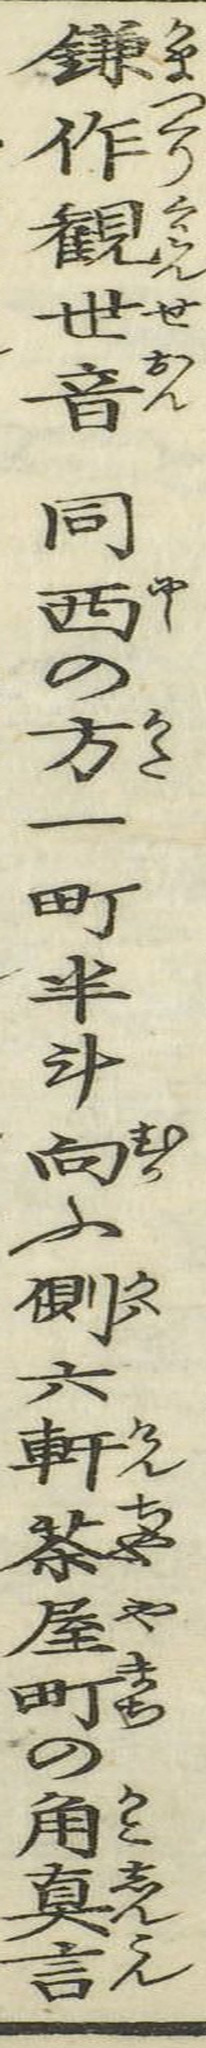鎌作観世音同西の方一町半斗向ふ側六軒茶屋町の角真言
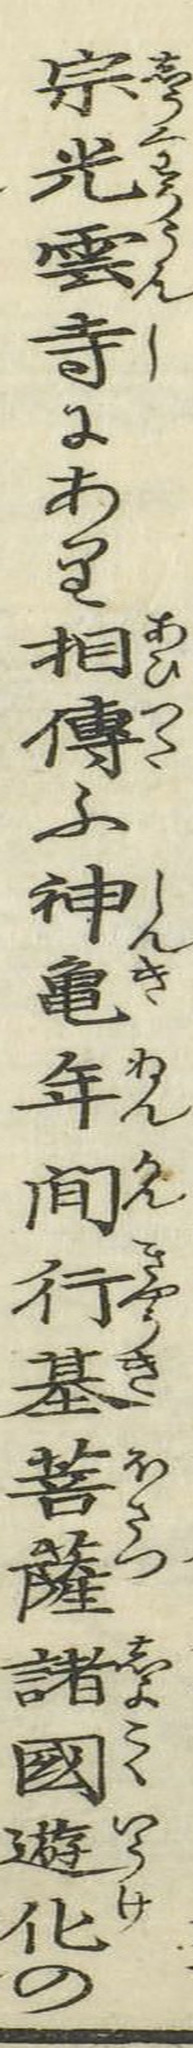宗光雲寺にあり相傳ふ神亀年間行基菩薩諸國遊化の
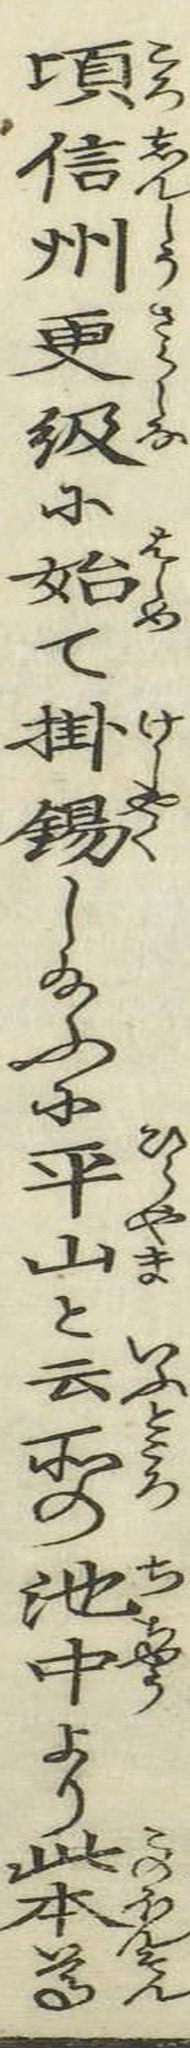頃信州更級に始て掛錫し給ふに平山と云所の池中より此本尊
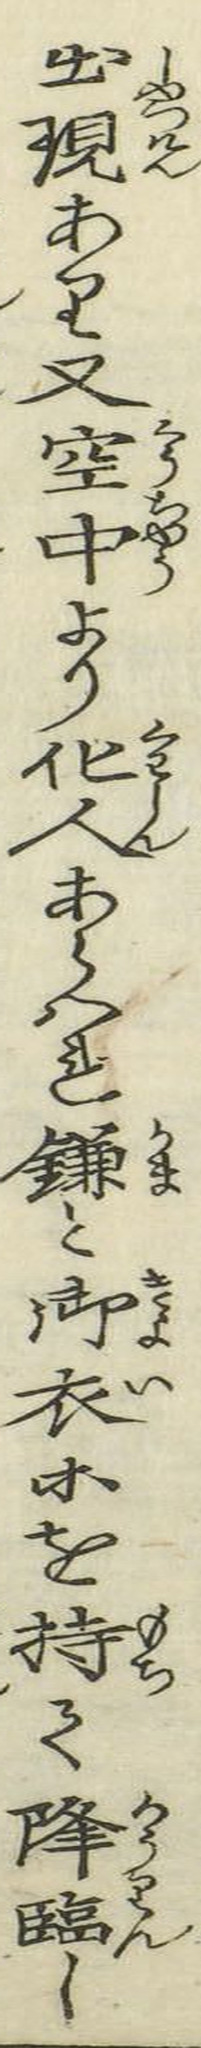出現あり又空中より化人あらはれ鎌と御衣等を持て降臨し
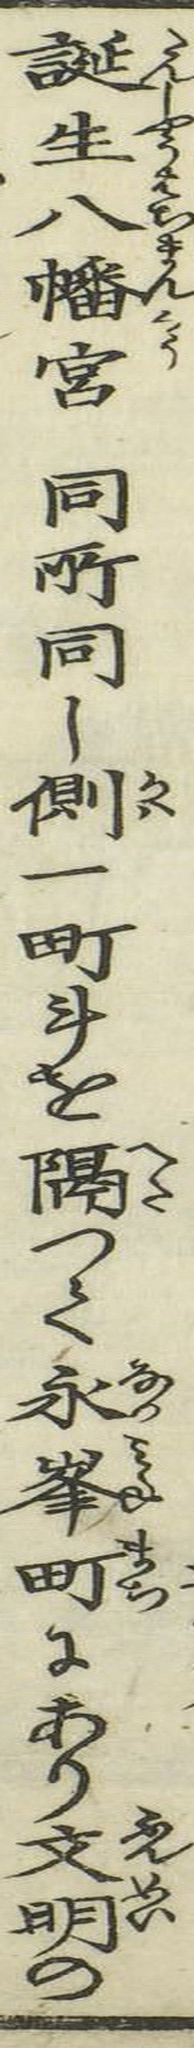誕生八幡宮同所同し側一町斗を隔つて永峯町にあり文明の
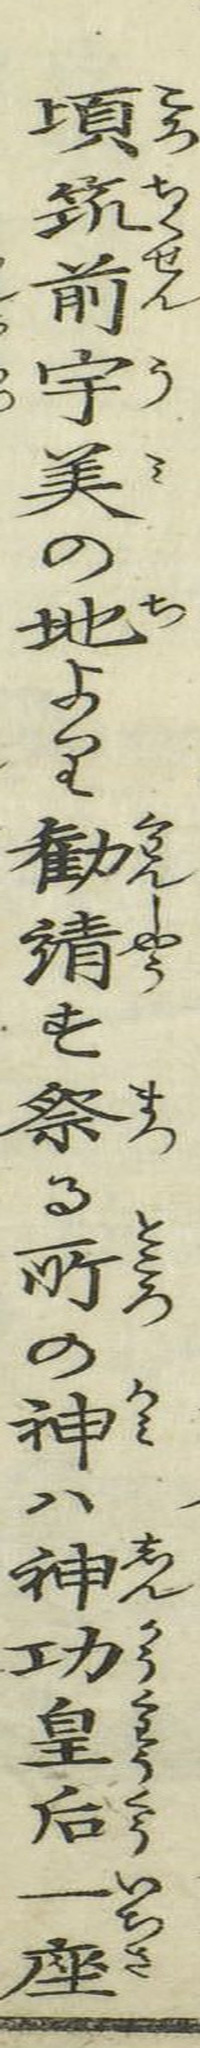頃筑前宇美の地より勧請す祭る所の神は神功皇后一座
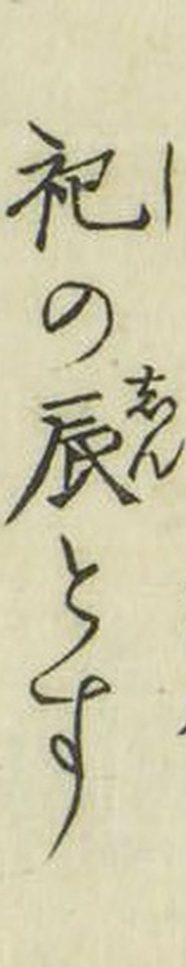祀の辰とす

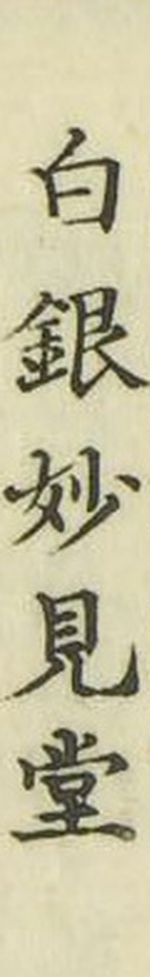白銀妙見堂
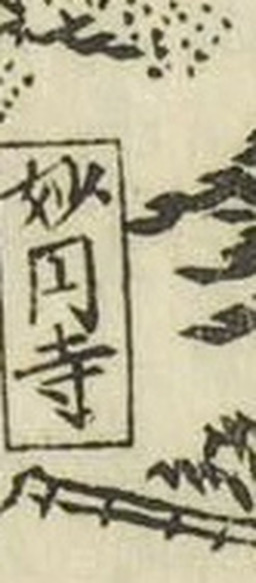妙円寺

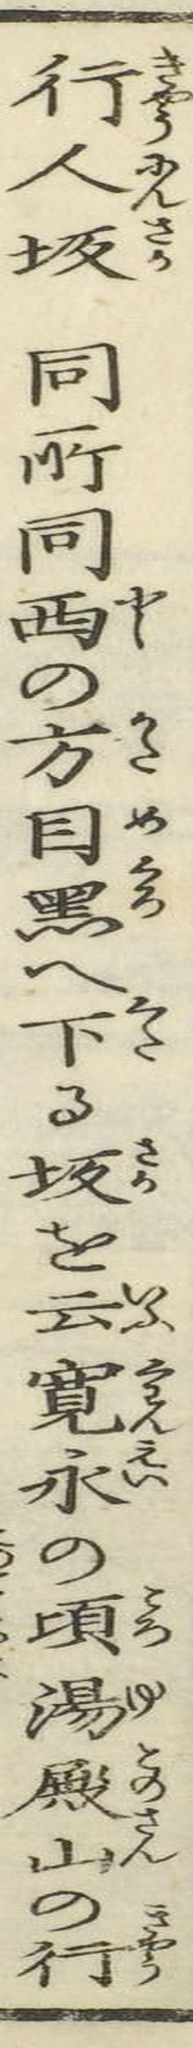行人坂同所同西の方目黑へ下る坂を云寛永の頃湯殿山の行
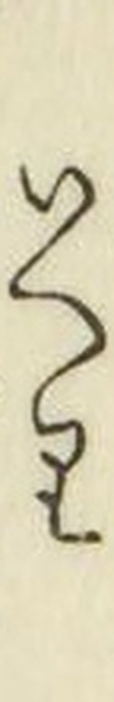いなり
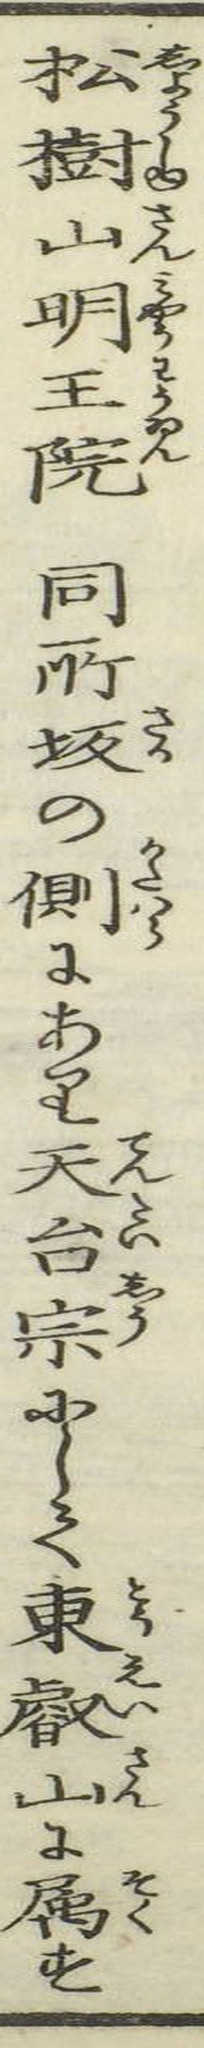松樹山明王院同所坂の側にあり天台宗にして東叡山に属す
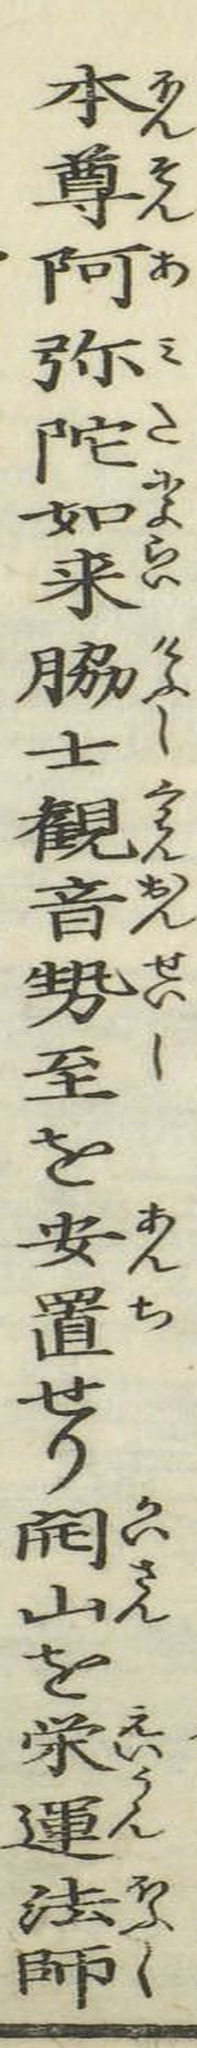本尊阿弥陀如来脇士観音勢至を安置せり開山を栄運法師
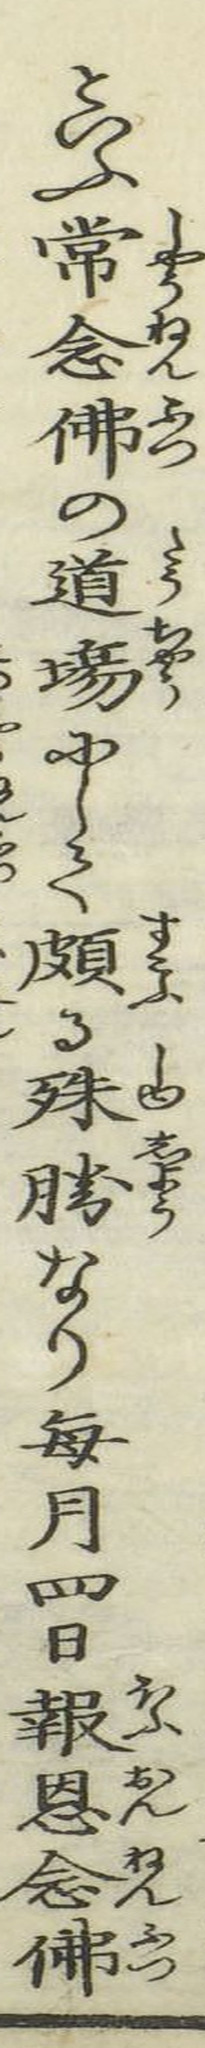といふ常念佛の道塲にして頗る殊勝なり毎月四日報恩念佛

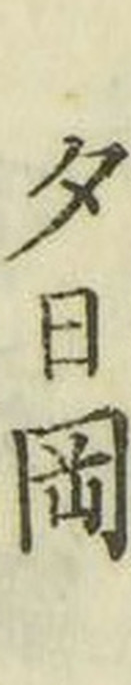夕日岡
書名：江戸名所図会 20巻 巻之7
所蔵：東京学芸大学教育コンテンツアーカイブ
